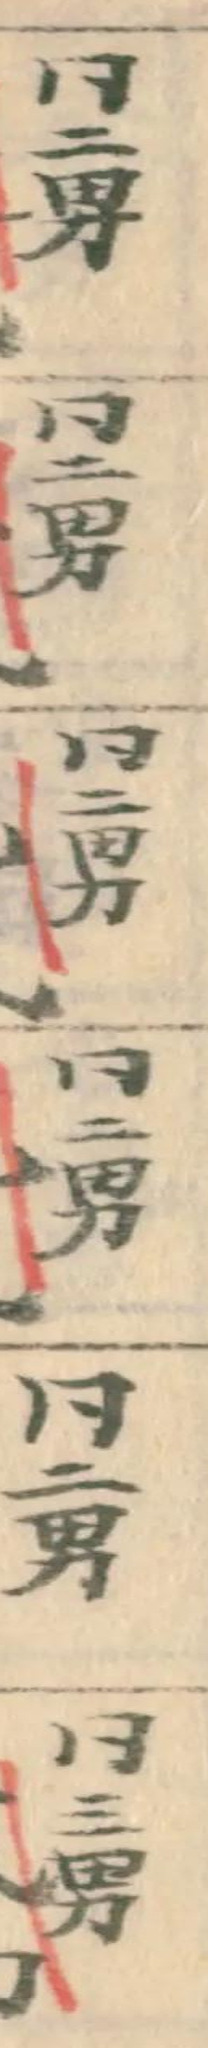同二男同二男同二男同二男同二男同三男
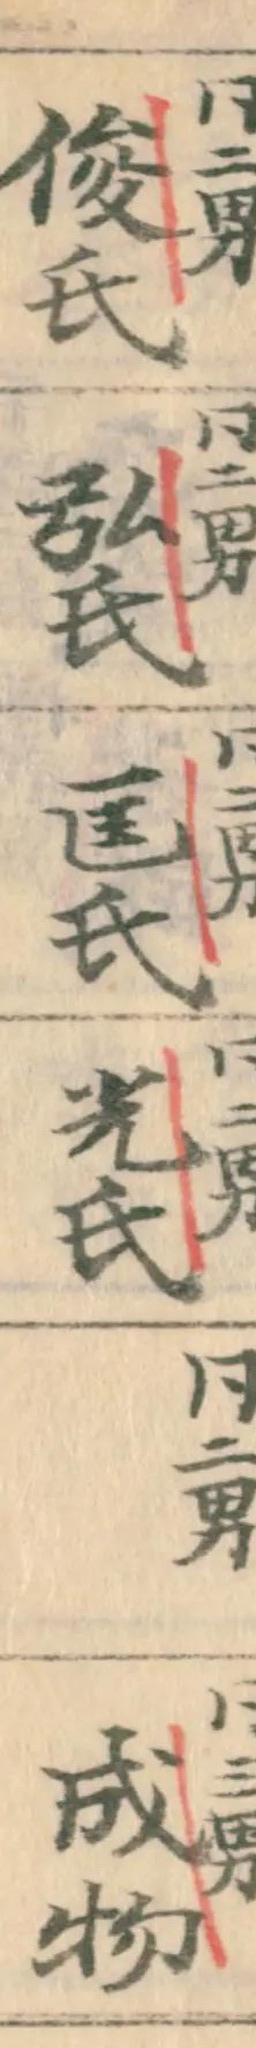俊氏弘氏匡氏光氏成物
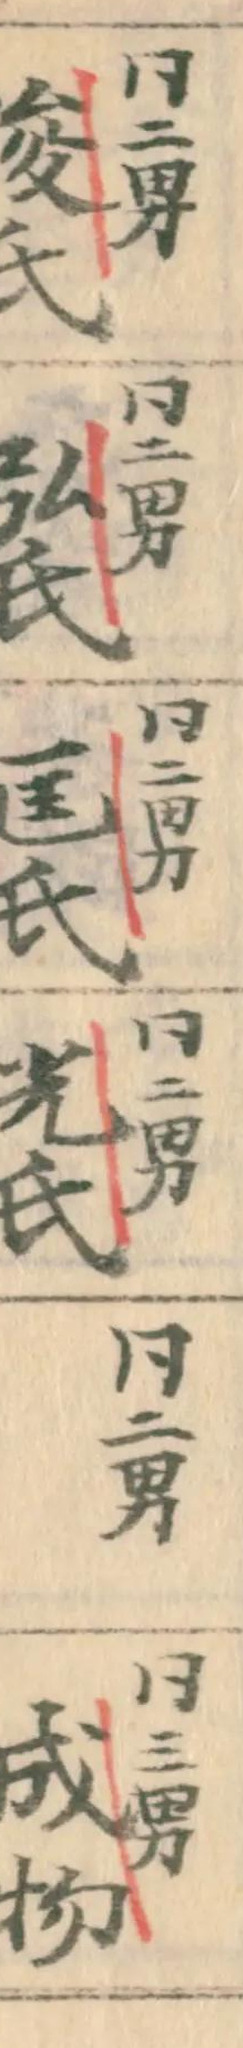同二男同二男同二男同二男同二男同三男
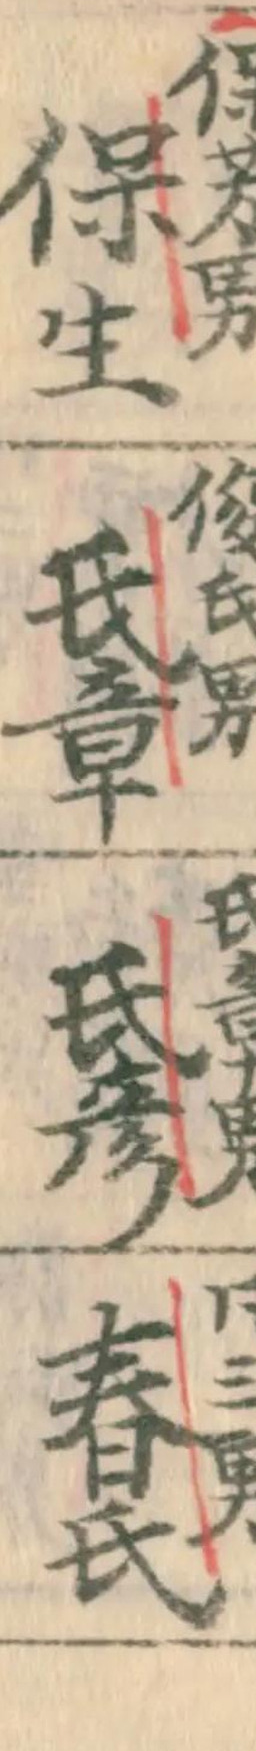保生氏章氏彦春氏成
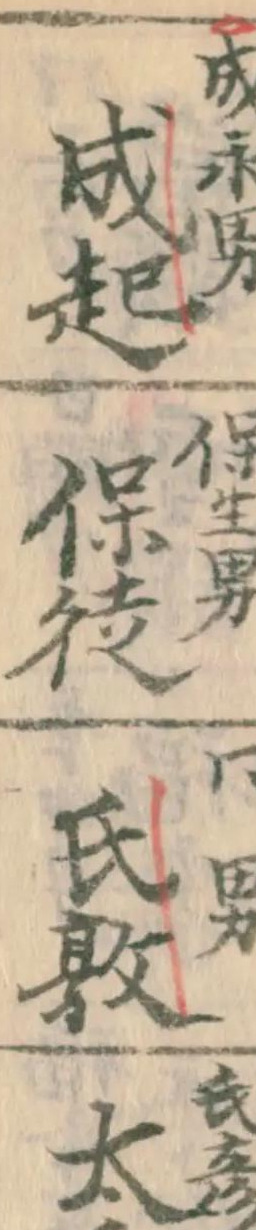成起保徒氏敦太氏
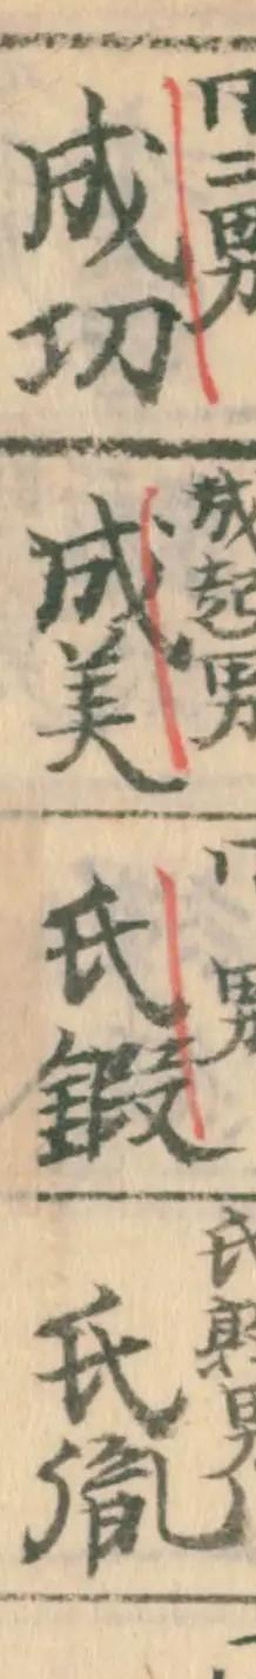成功成美氏鍛氏胤

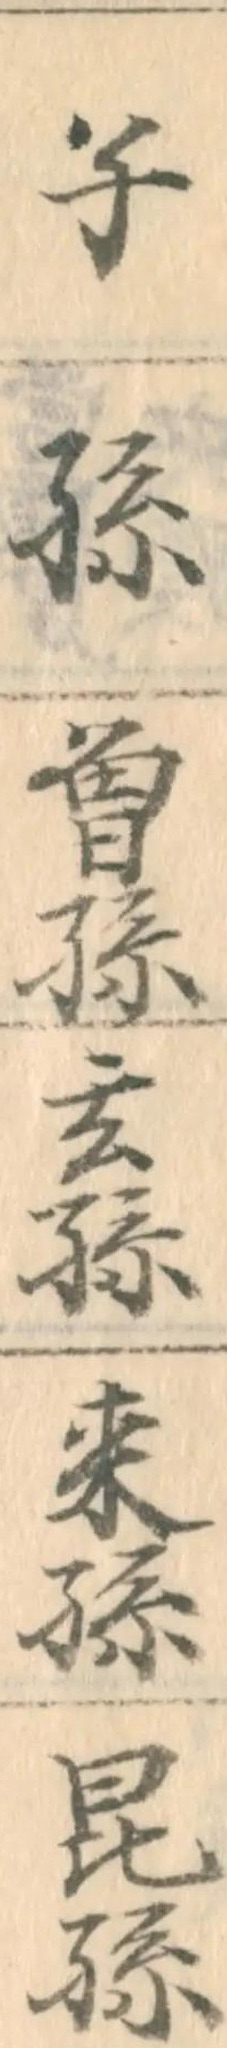子孫曽孫玄孫来孫昆孫
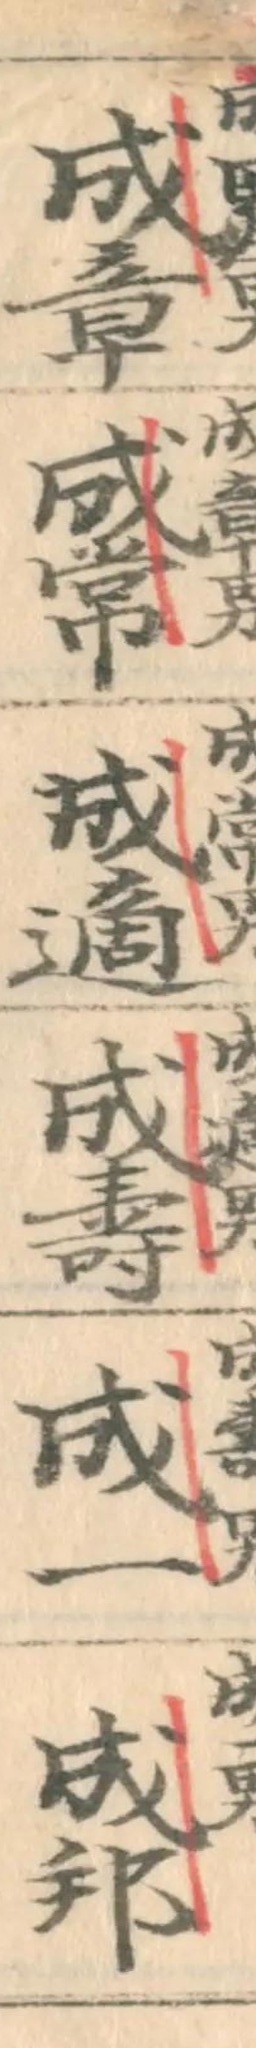成章成常成適成壽成一成邦
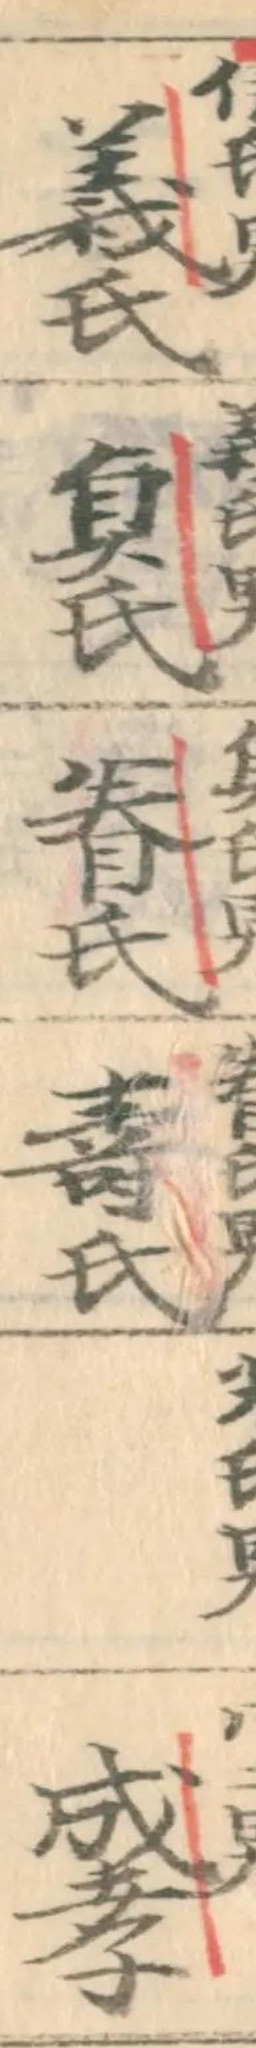義氏貞氏眷氏壽氏成孝
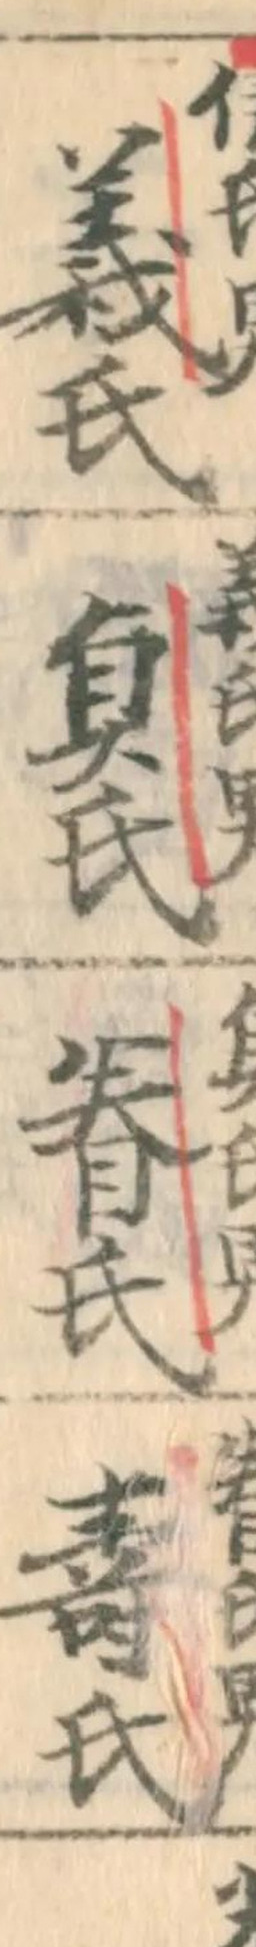義氏貞氏眷氏壽氏成孝
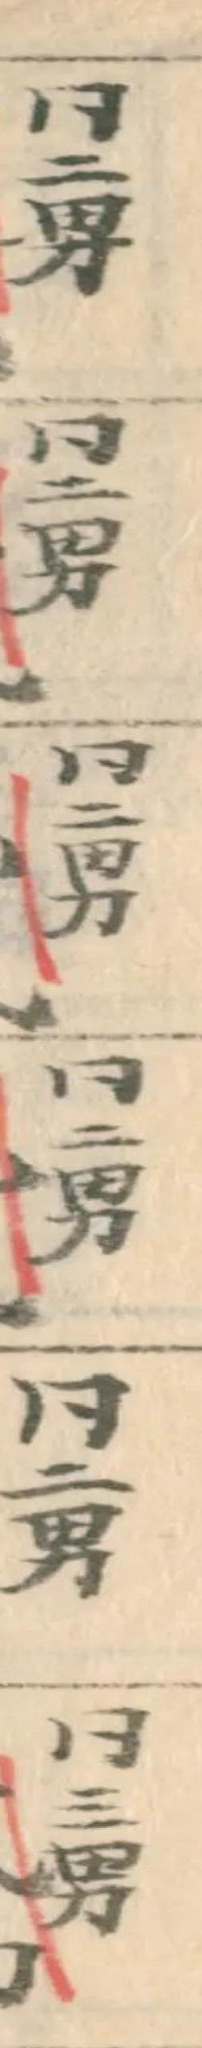同二男同二男同二男同二男同二男同三男
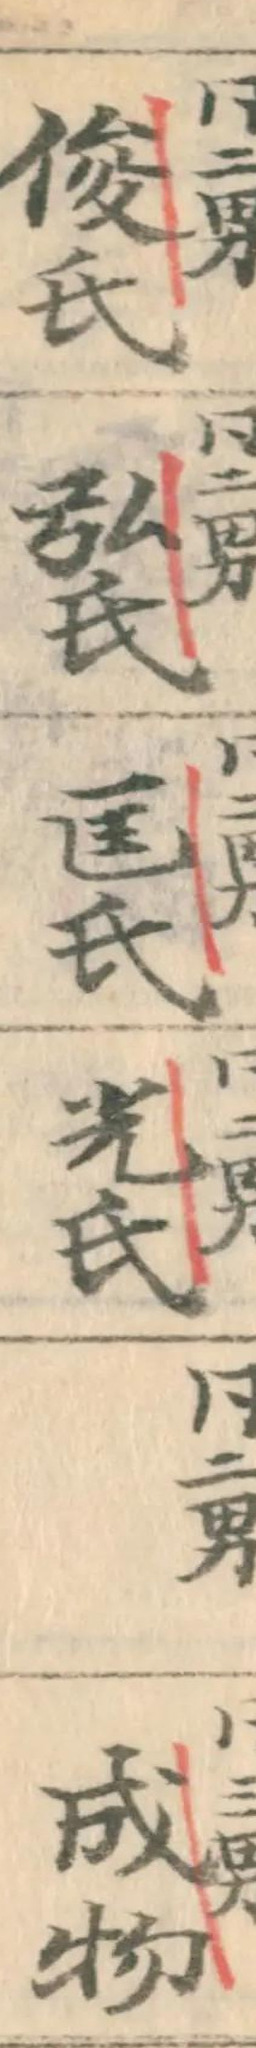俊氏弘氏匡氏光氏成物
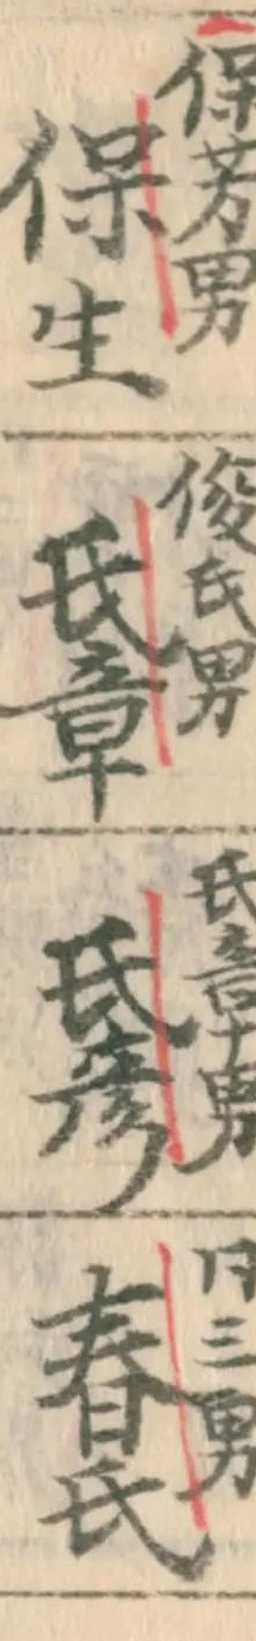保生氏章氏彦春氏成
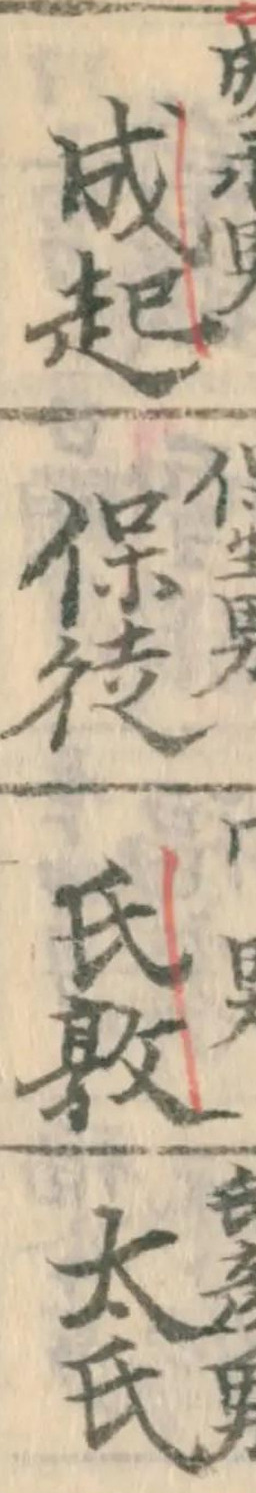成起保徒氏敦太氏
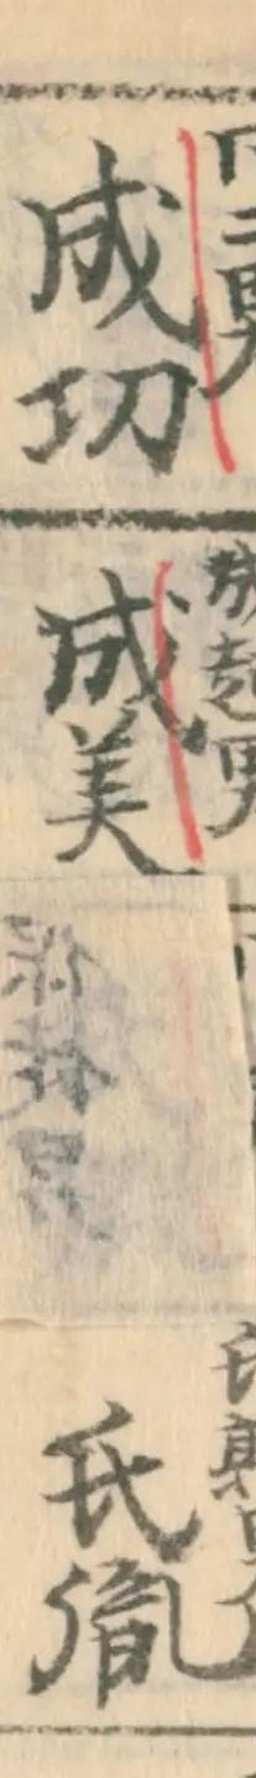成功成美氏胤
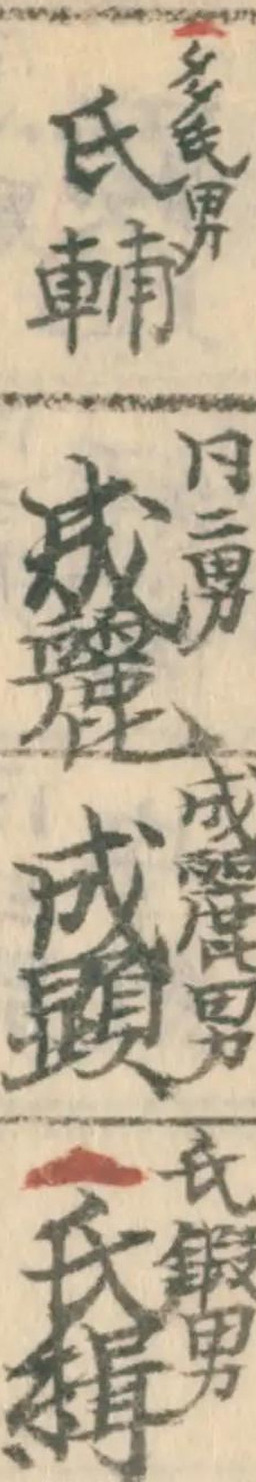氏輔成麗成顕▲氏緝
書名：賀茂社記録. 第24冊
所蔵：国立国会図書館 National Diet Library, JAPAN
